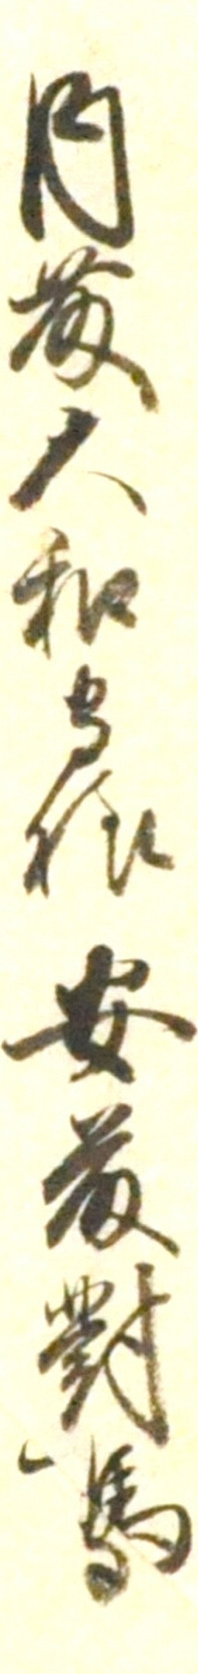内藤大和守様安藤対馬

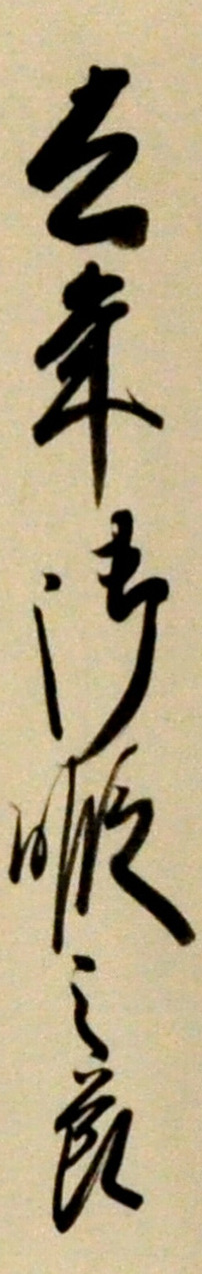去年御暇之節
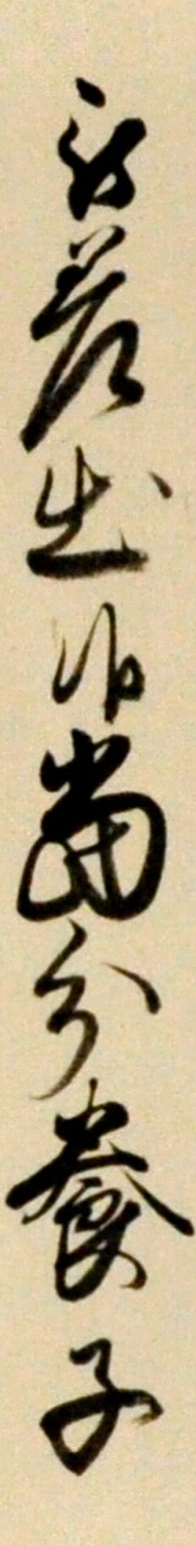被差出候当分養子
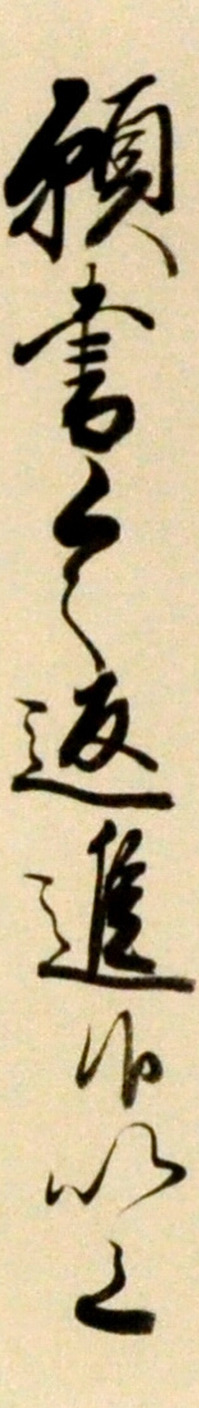願書令返進候以上
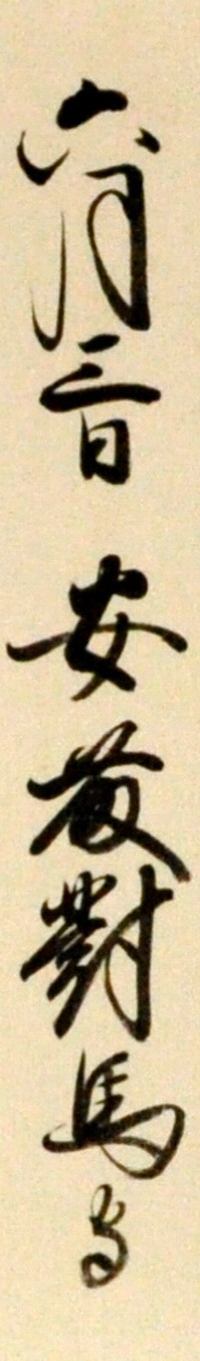六月三日安藤対馬守
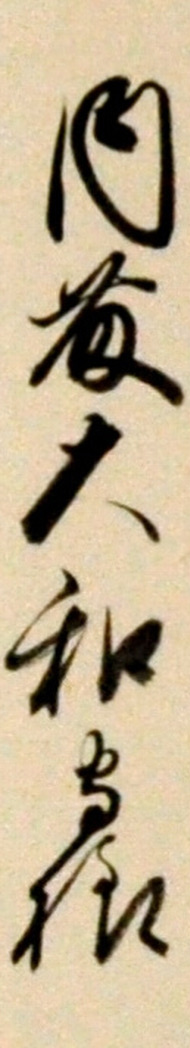内藤大和守様
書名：書状
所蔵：伊那市立高遠町図書館・合同会社AMANE
